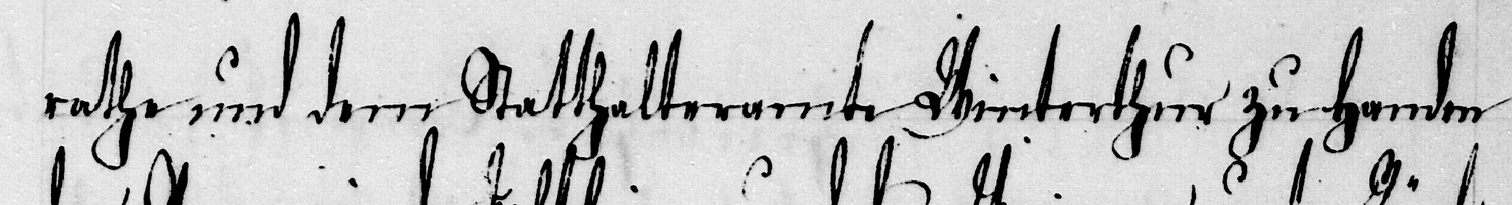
rathe und dem Statthalteramte Winterthur zu Handen
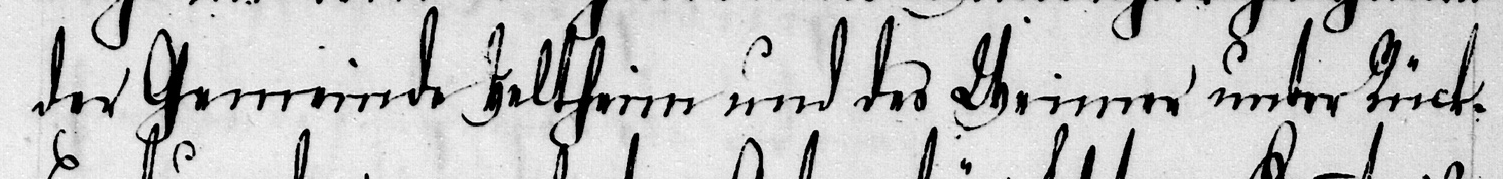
der Gemeinde Veltheim und des Weimer unter Rück¬
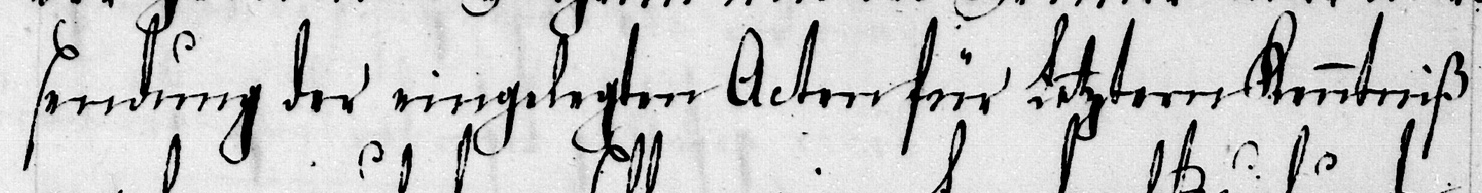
sendung der eingelegten Acten für Letztern, Kenntniß
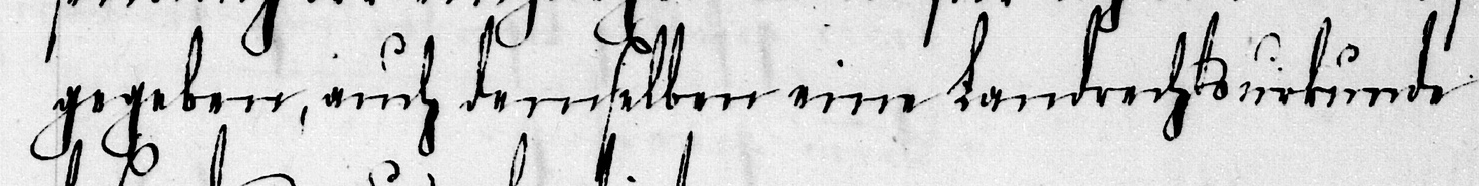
gegeben, auch demselben eine Landrechtsurkunde
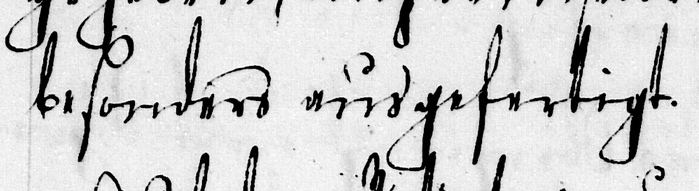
besonders ausgefertigt.
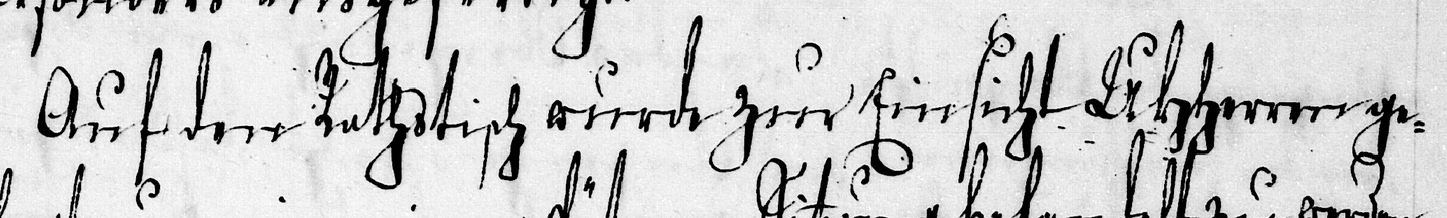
Auf den Rathstisch wurde zur Einsicht UHHerren ge¬
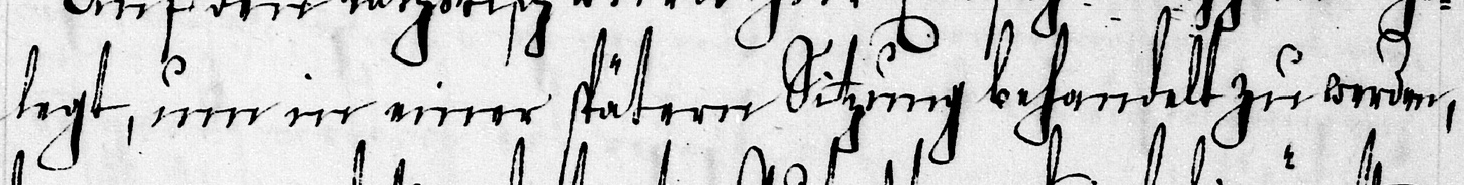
legt, um in einer spätern Sitzung behandelt zu werden,
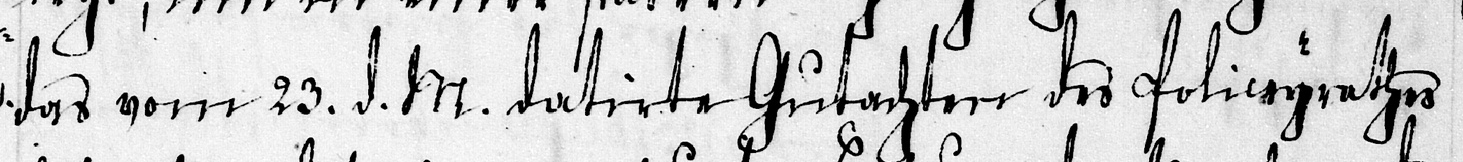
das vom 23. d. M. datirte Gutachten des Policeyrathes
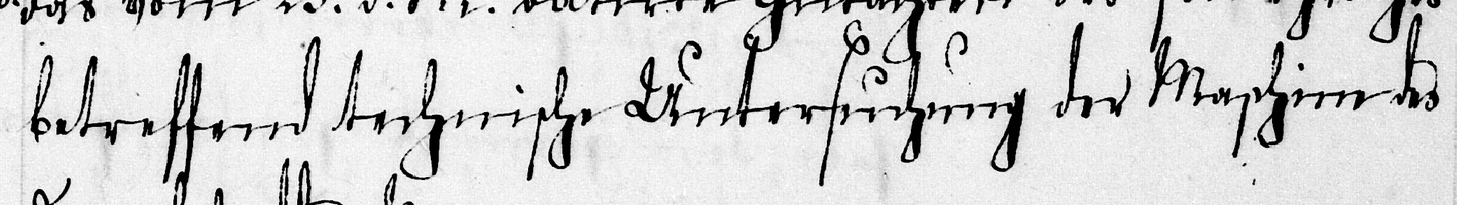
betreffend technische Untersuchung der Maschine des
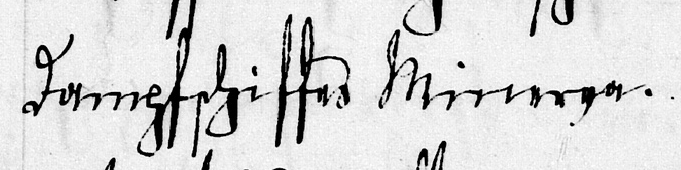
Dampfschiffes Minerva.
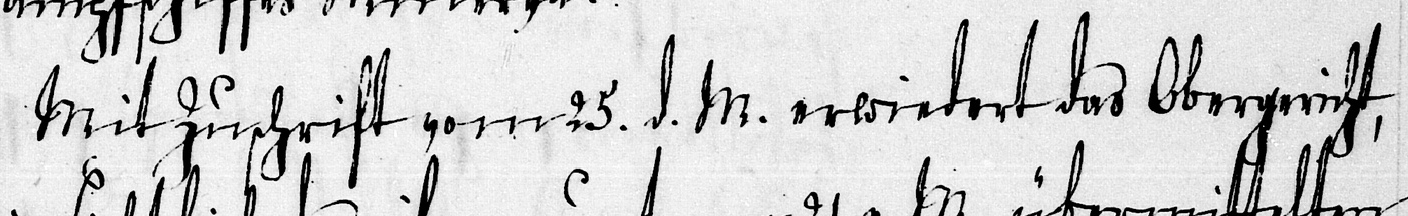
Mit Zuschrift vom 25. d. M. erwiedert das Obergericht,
